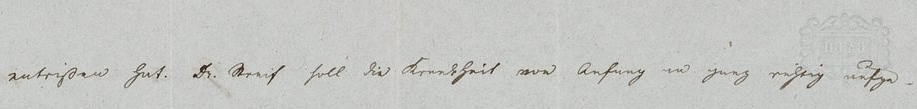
entrißen hat. Dr. Streif soll die Krankheit von Anfang an ganz richtig aufge-
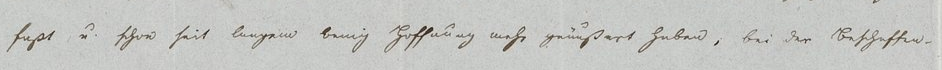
faßt,u. schon seit langem wenig Hoffnung mehr geäußert haben; bei der Beschaffen-
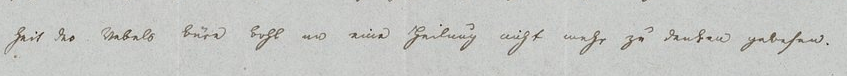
heit des Uebels wäre wohl an eine Heilung nicht mehr zu denken gewesen.
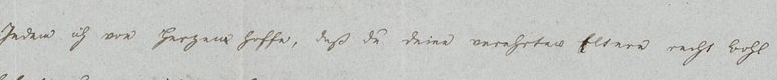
Indem ich von Herzen hoffe, dass Du Deine verehrten Eltern recht wohl
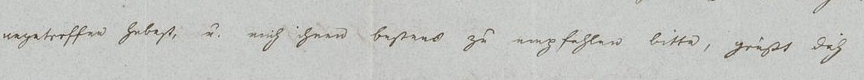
angetroffen habest, u. mich ihnen bestens zu empfehlen bitte, grüßt Dich
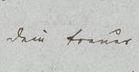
Dein treuer
